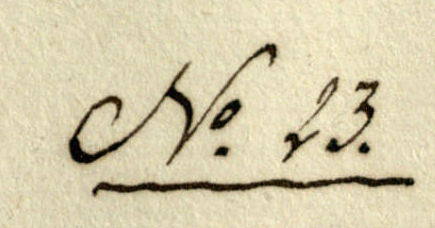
No 23.
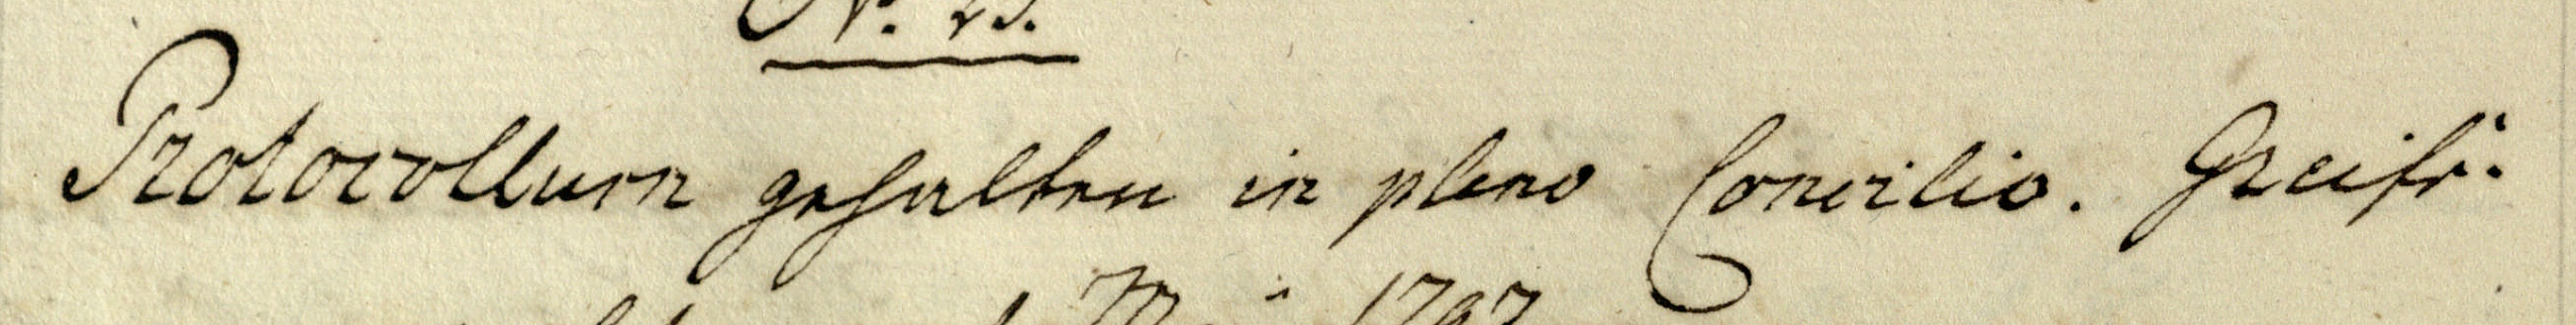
Protocollum gehalten in pleno Concilio. Greifs¬
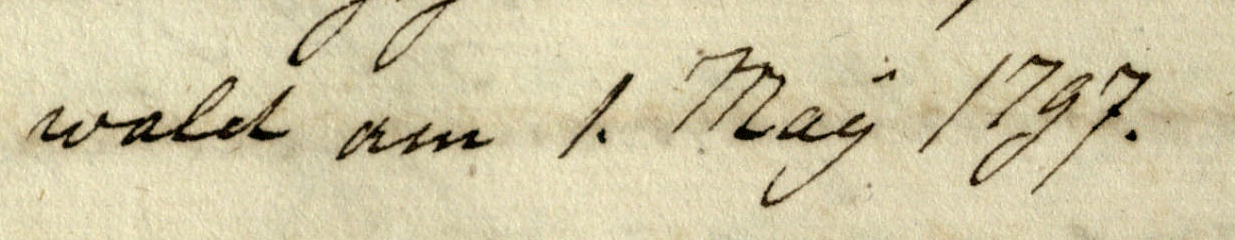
wald am 1. Maÿ 1797.
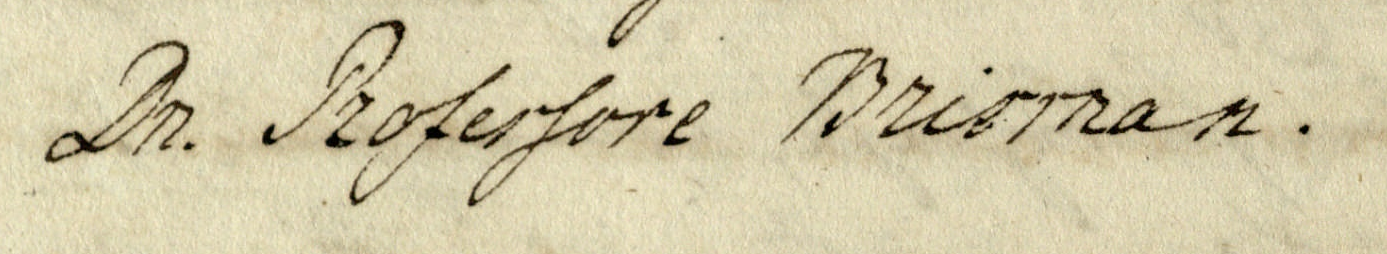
Dn. Professore Brisman.
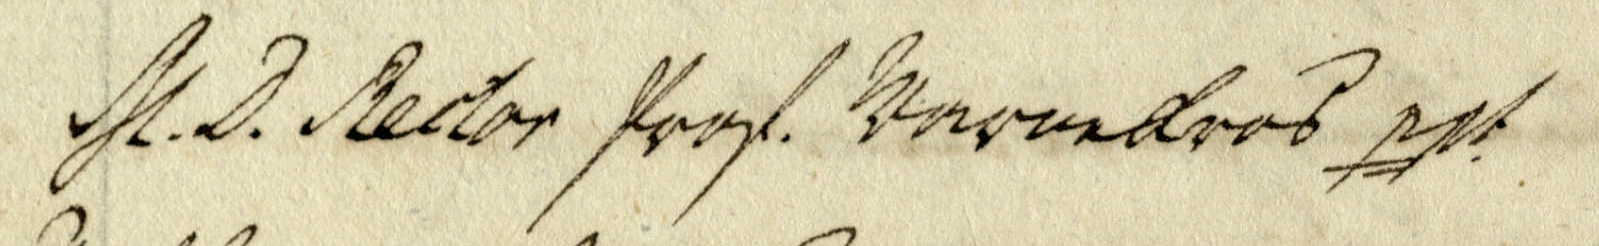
M D. Rector Prof. Warnekros ppt
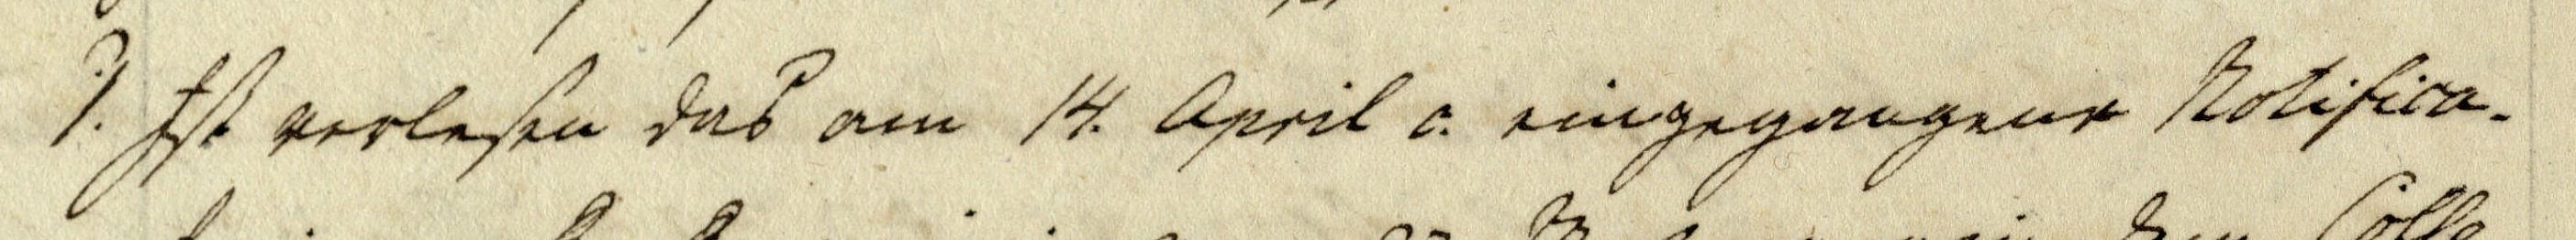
1. Ist verlesen das am 14. April c. eingegangene Notifica¬
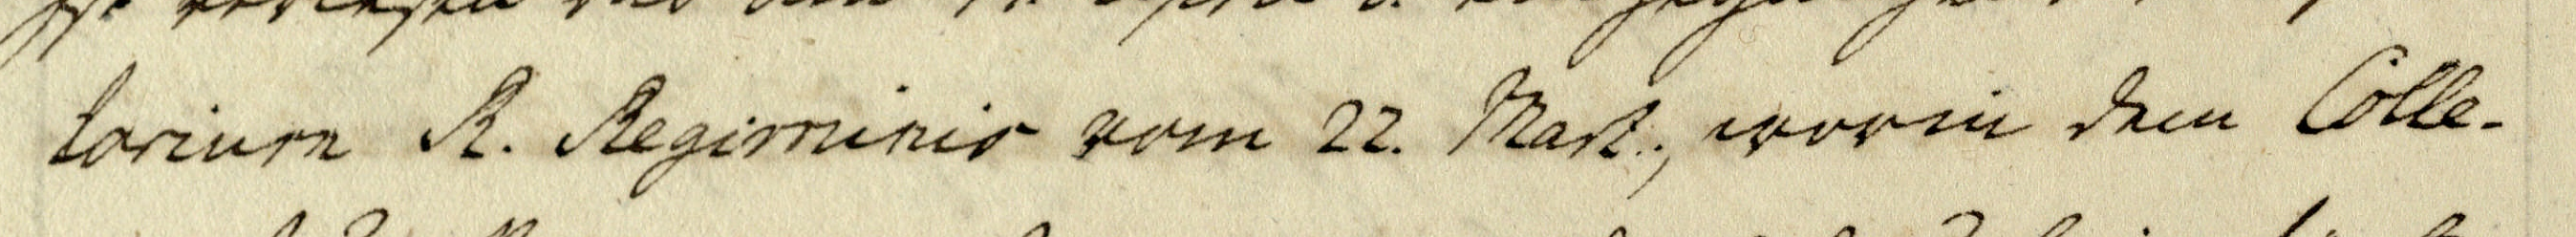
torium R. Regiminis vom 22. Mart., worin dem Colle¬
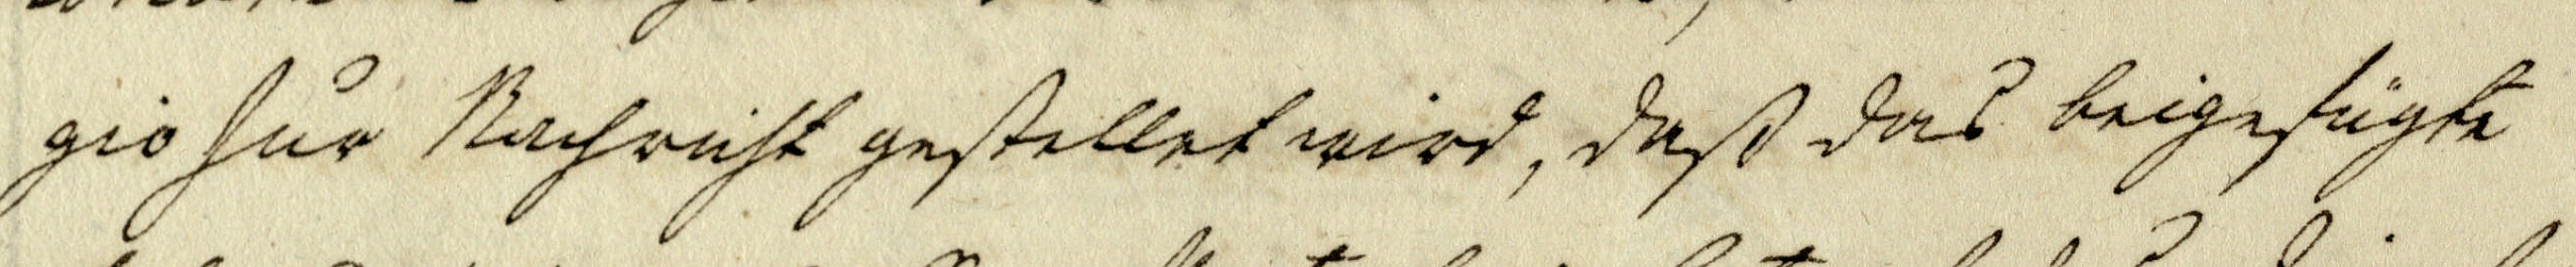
gio zur Nachricht gestellet wird, daß das beigefügte
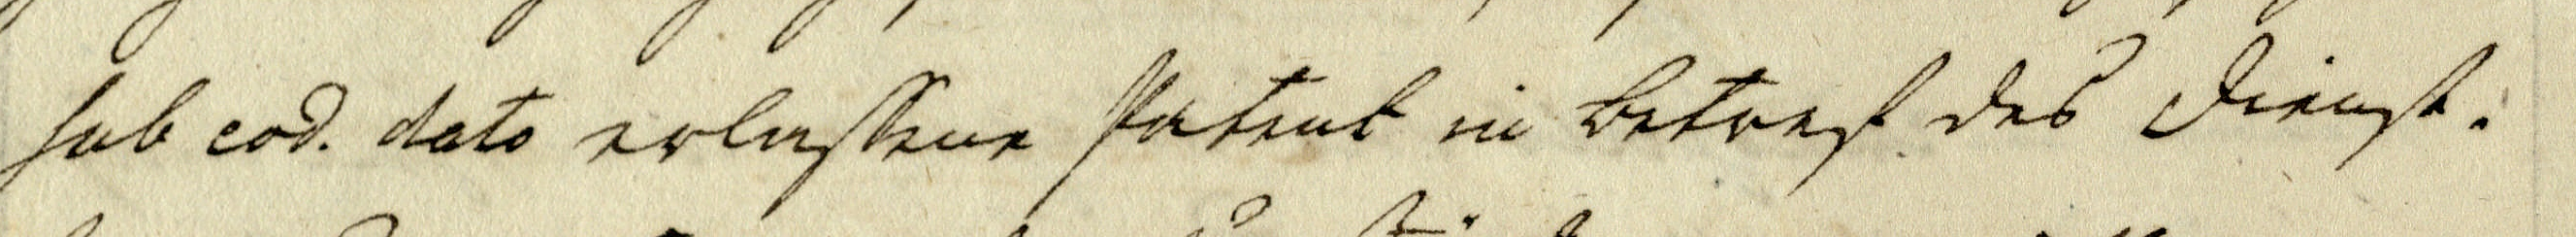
sub eod. dato erlassene Patent in Betref des Dienst¬
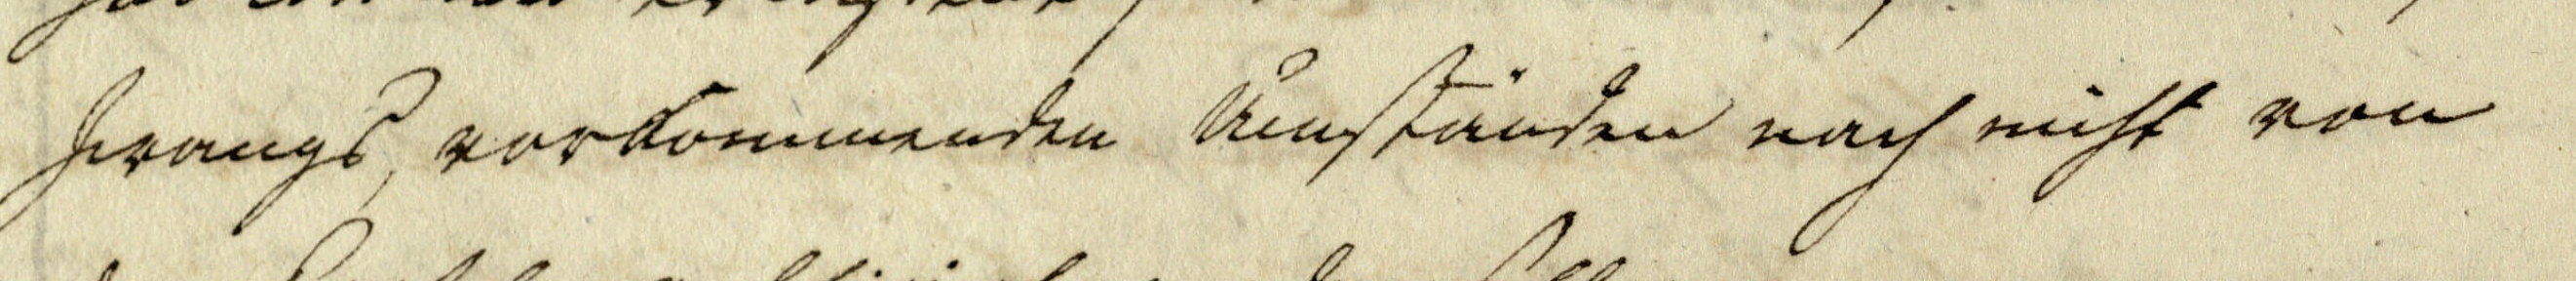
zwangs, vorkommenden Umständen nach nicht von
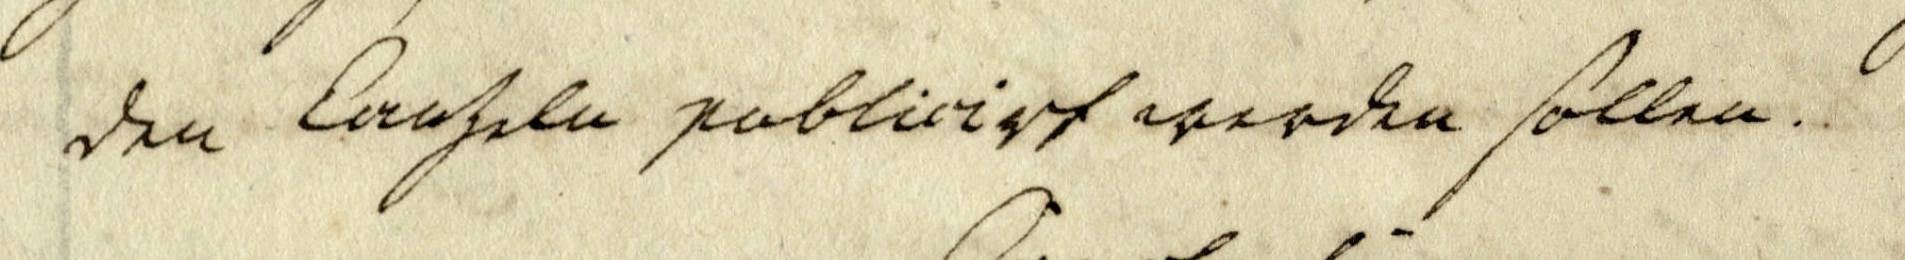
den Canzeln publicirt werden sollen.
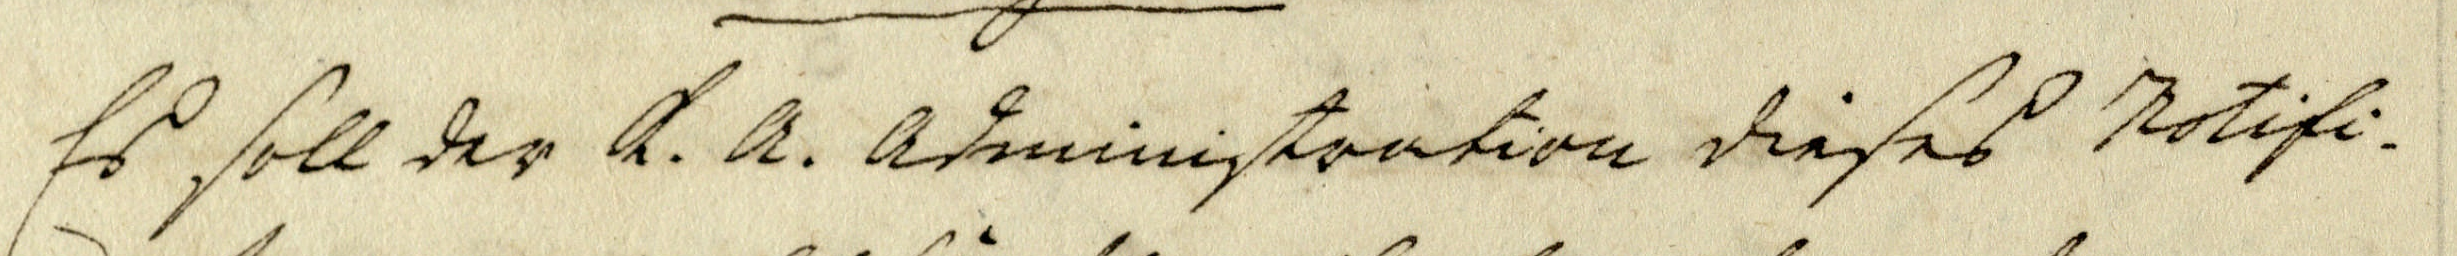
Es soll der K. A. Administration dieses Notifi¬
